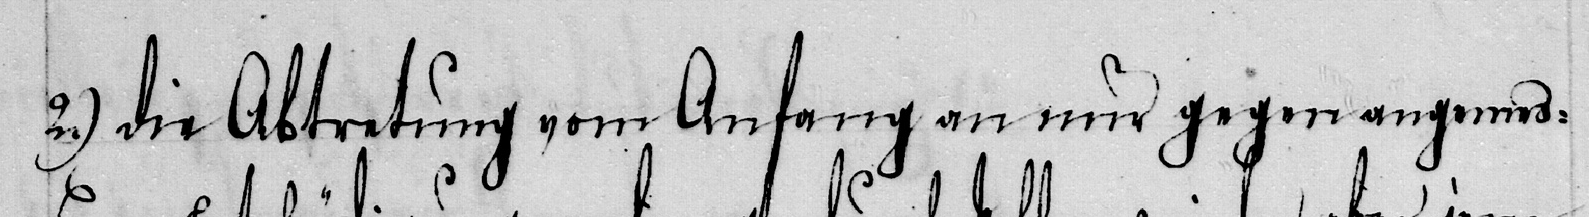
2.) die Abtretung vom Anfang an nur gegen angemeß¬
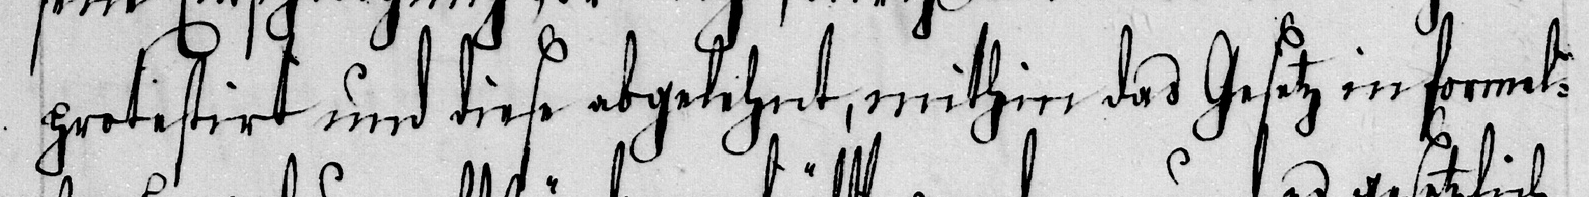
protestirt und diese abgelehnt, mithin das Gesetz in formel¬
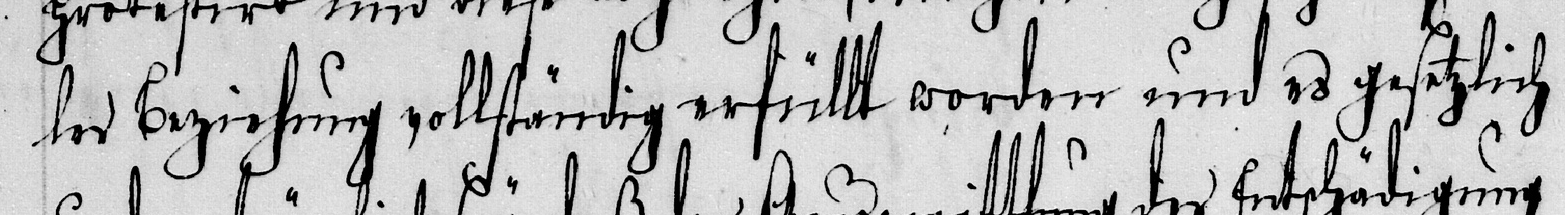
ler Beziehung vollständig erfüllt worden und es gesetzlich
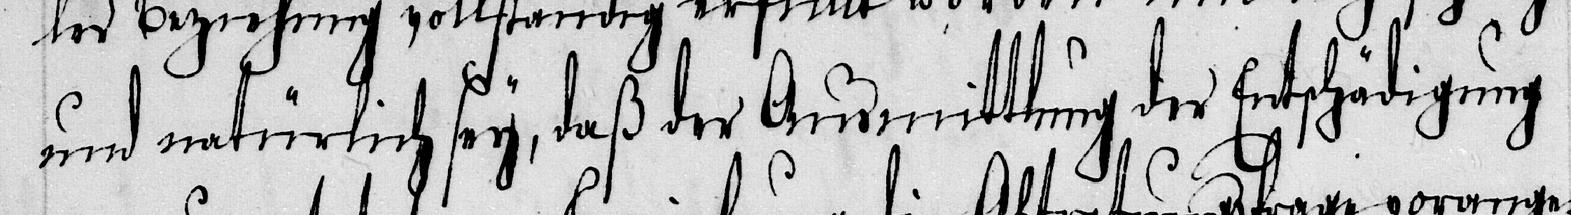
und natürlich sey, daß der Ausmittlung der Entschädigung
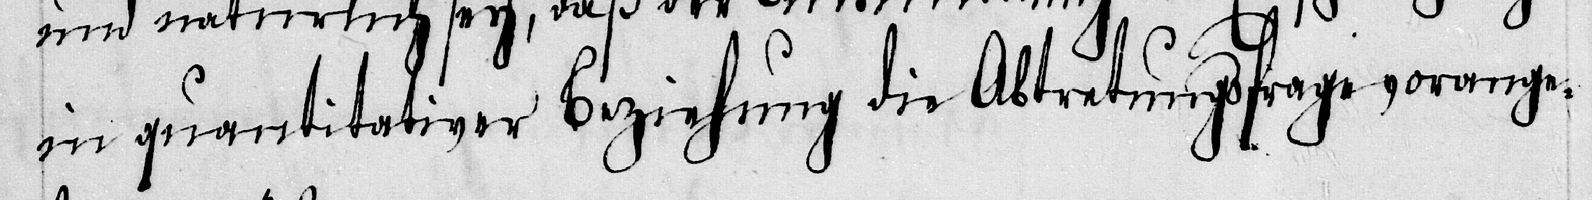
in quantitativer Beziehung die Abtretungsfrage vorange¬
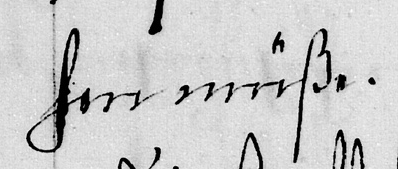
hen müße.
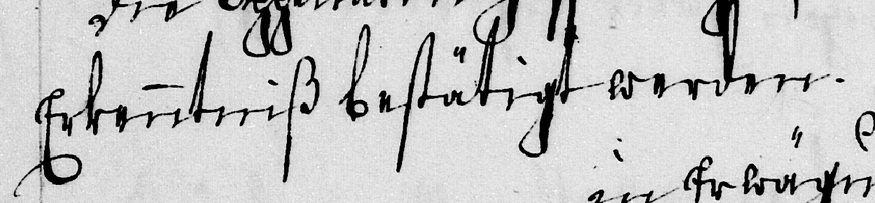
Erkenntniß bestätigt werden.
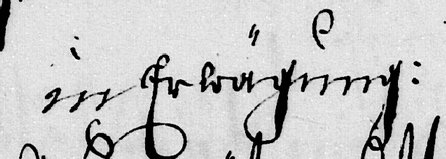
in Erwägung:
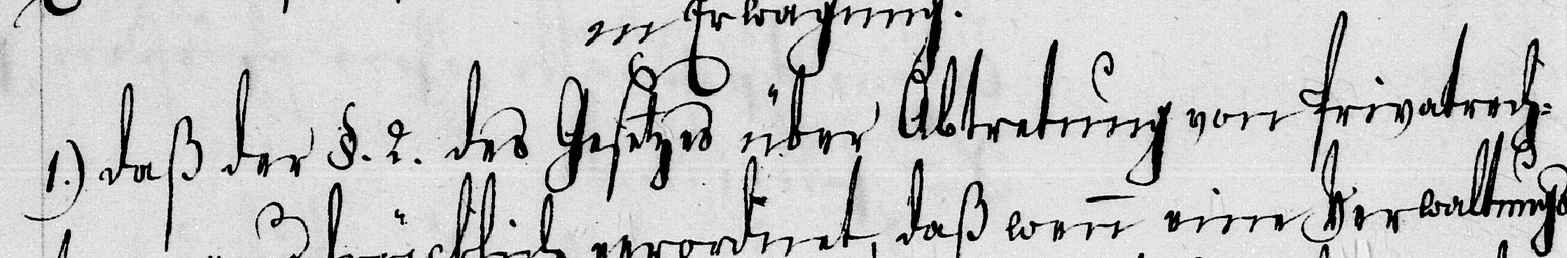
daß der §. 2. des Gesetzes über Abtretung von Privatrec¬
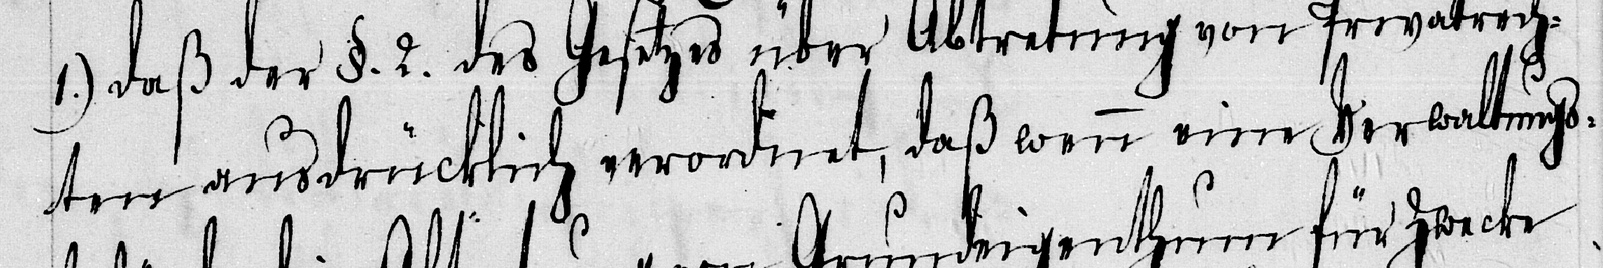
hten ausdrücklich verordnet, daß wenn eine Verwaltung¬
